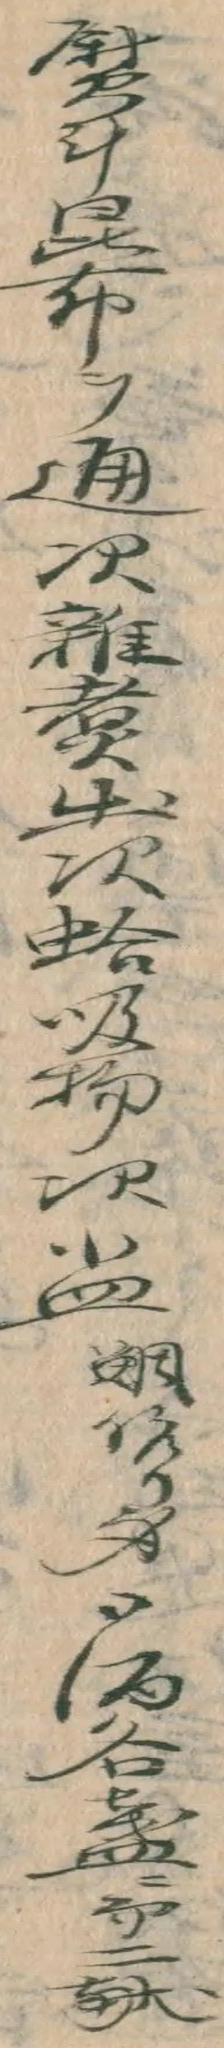熨斗昆布ヲ通次雑煮出次蛤吸物次小皿鯛リ身御酒盞ニ而二献
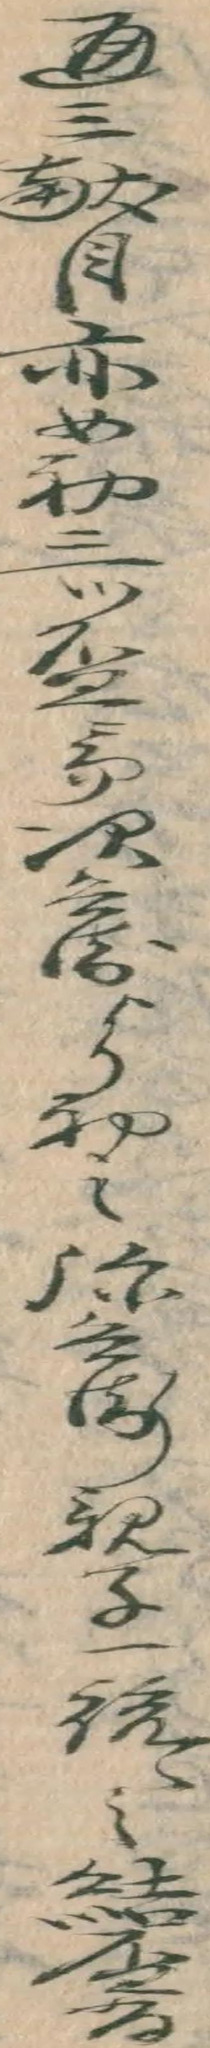通三献自亦如初三ツ盃ニ而次兵衛より初之弥兵衛親子一統へ之結盃有
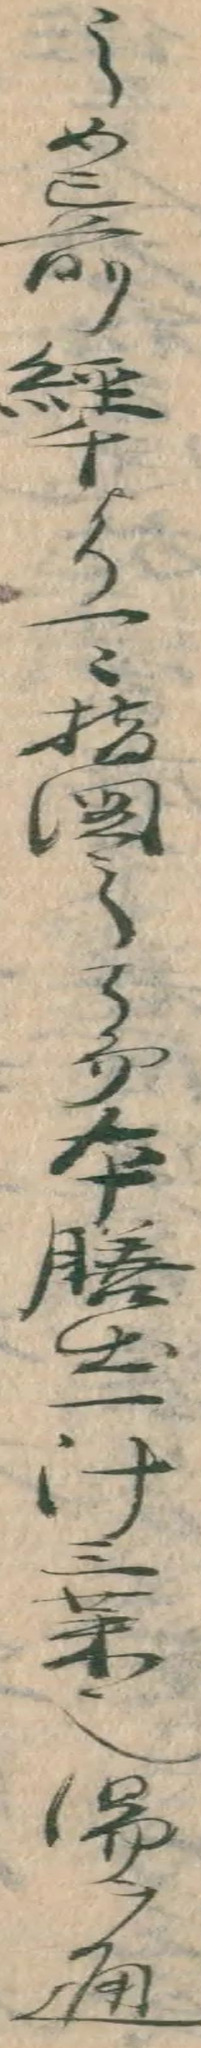之如已前経千より一々指図之了而本膳出一汁三菜也湯ヲ通
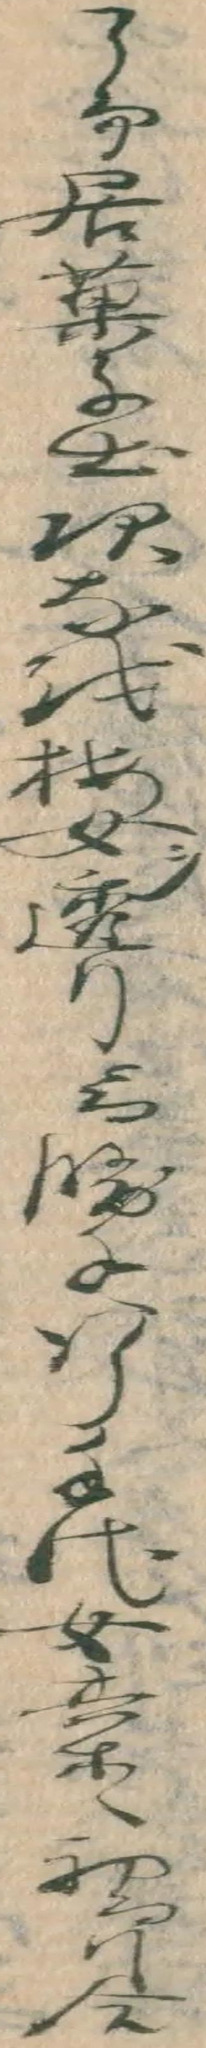了而居菓子出次なを梅女ヲ透引ニ而勝手ヘ引手代女共等へ初而引合
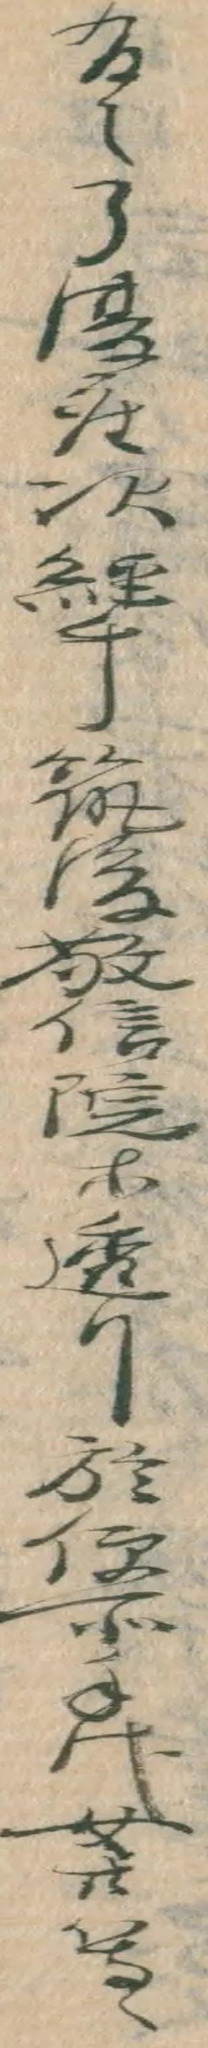有之了復座次経千筑後敬信院等透引於便所手代女共等へ
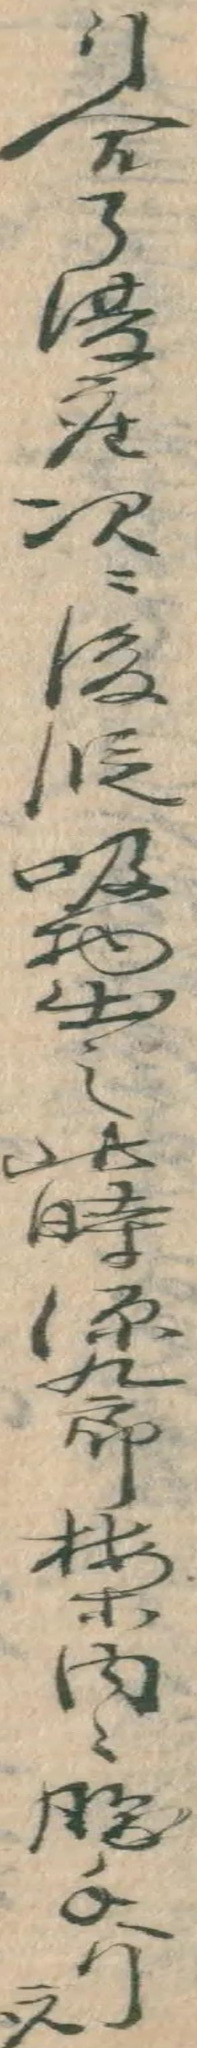引合了復座次に後段吸物出之此時源九郎梅等内々勝手へ引取
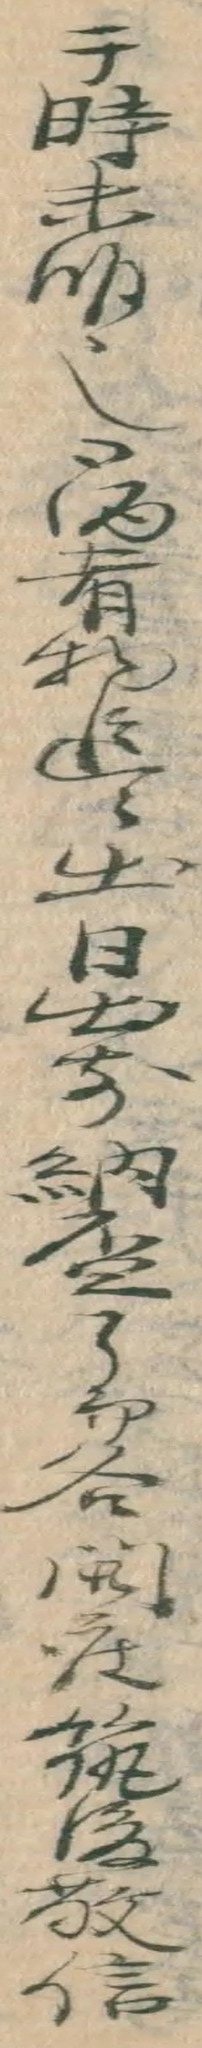于時未明也御酒肴物追〻出日出前納盃了而各開座筑後敬信
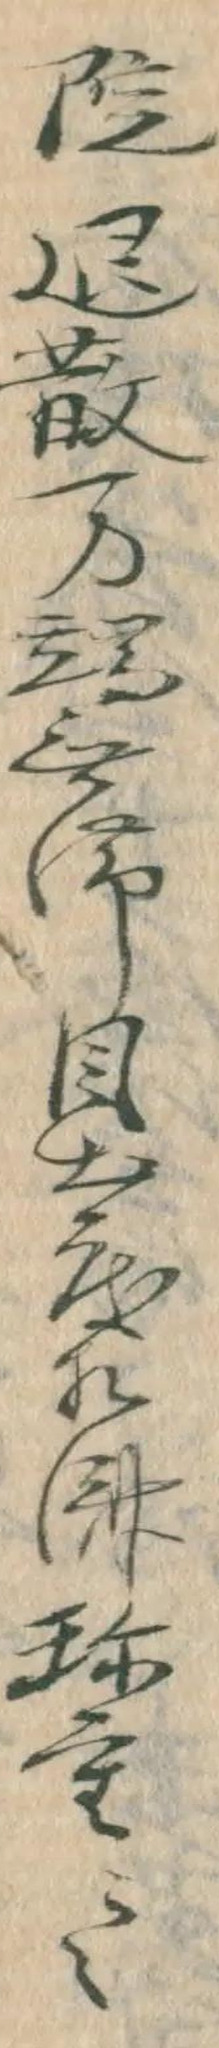院退散万端無滞目出度相済珍重々々
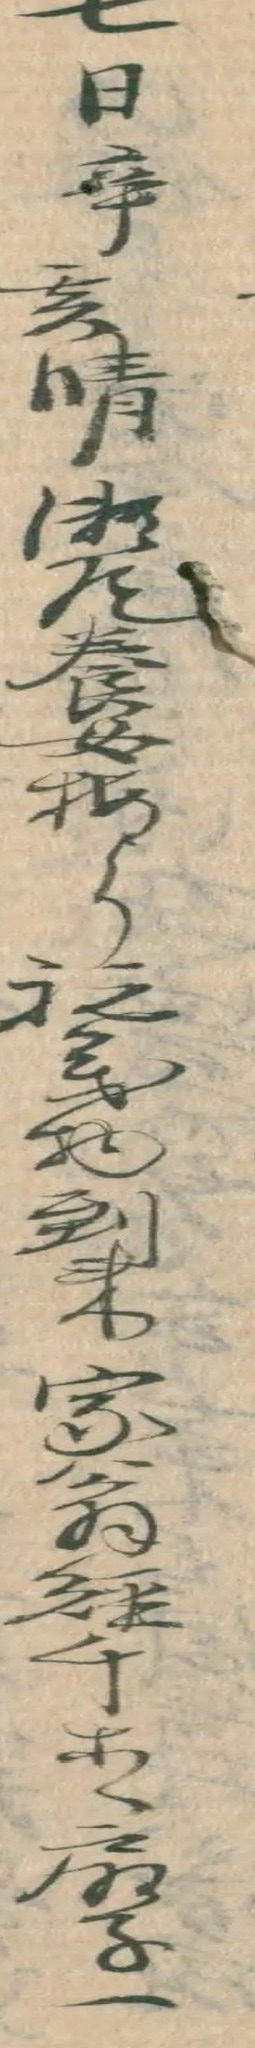七日辛亥晴瀬尾養女梅より祝義物到来家翁経千等へ扇子一
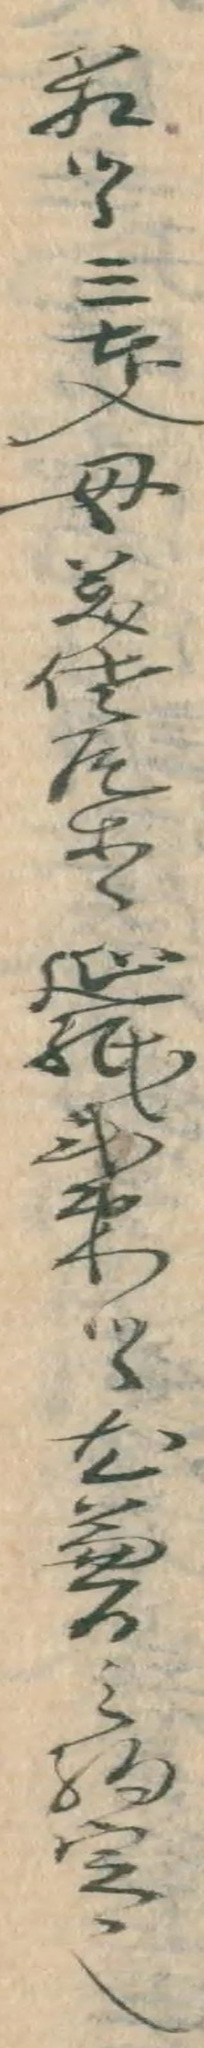箱ツヽ三本入母義佐屋等へ延紙弐束ツヽ尤兼日之約定也

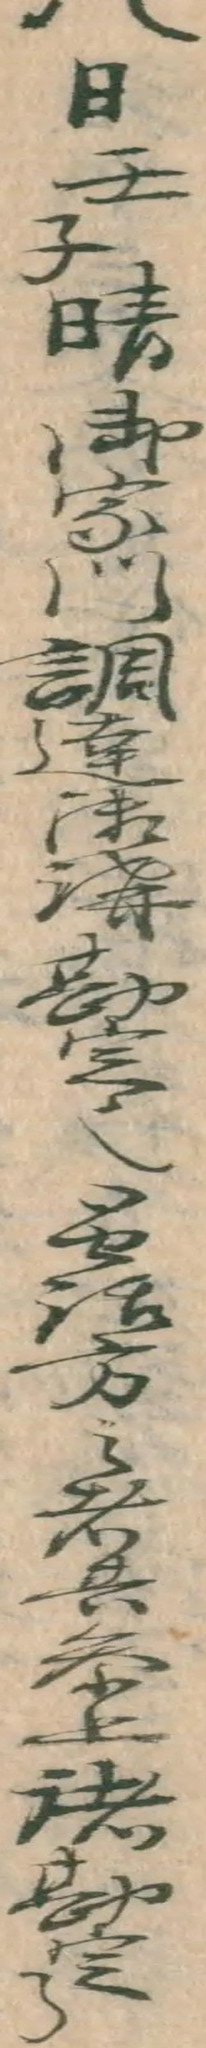八日壬子晴御家門調達御講勘定也御世話方之者共参上諸勘定了
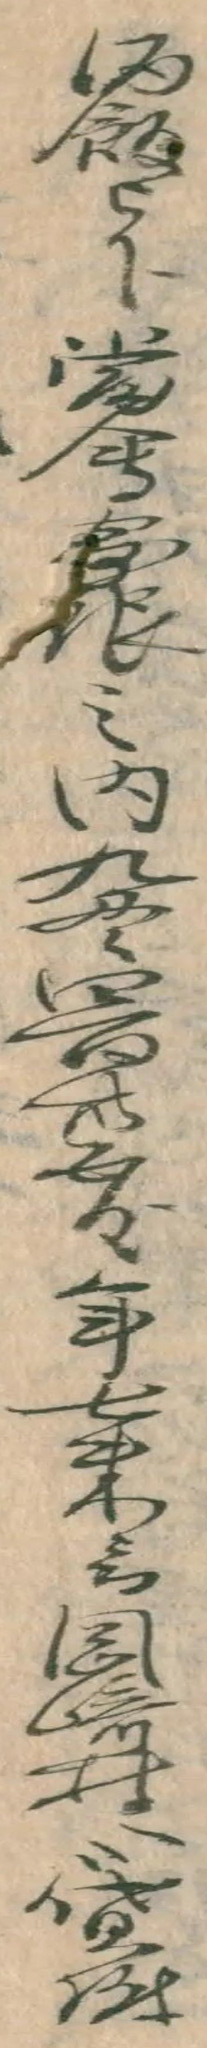酒飯被下當会歩銀之内九貫四百廿五匁年七朱ニ而岡崎村へ御貸附
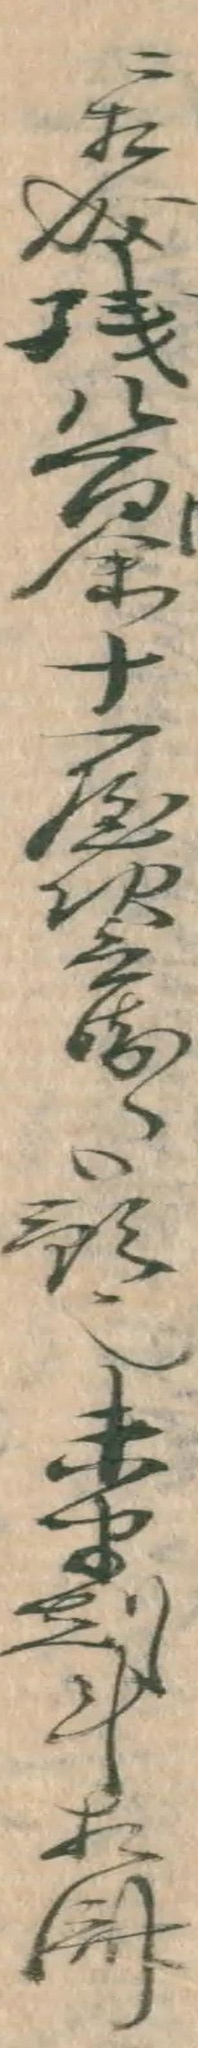ニ相成残八百目余十一屋次兵衛へ御預也未半刻斗相済
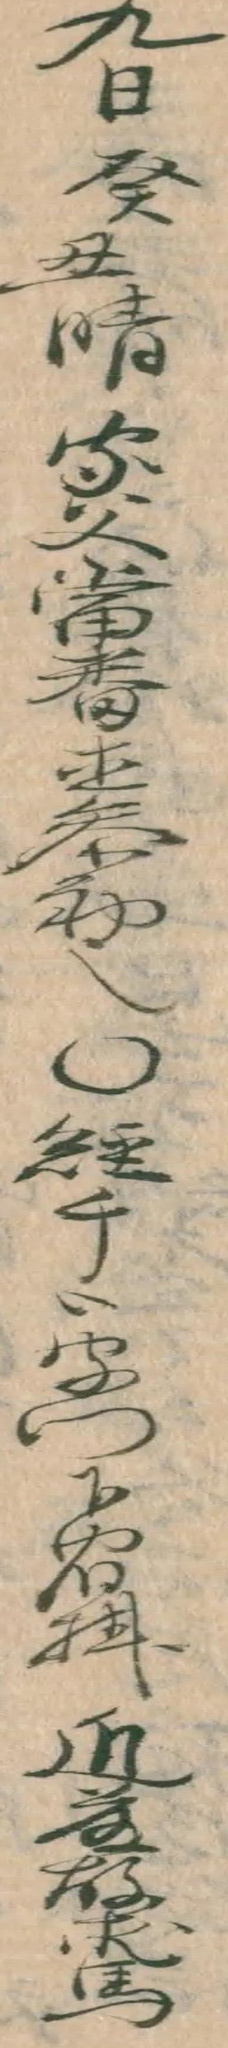九日癸丑晴家父當番直参勤也〇経千御家門下宿掛近藤故求馬
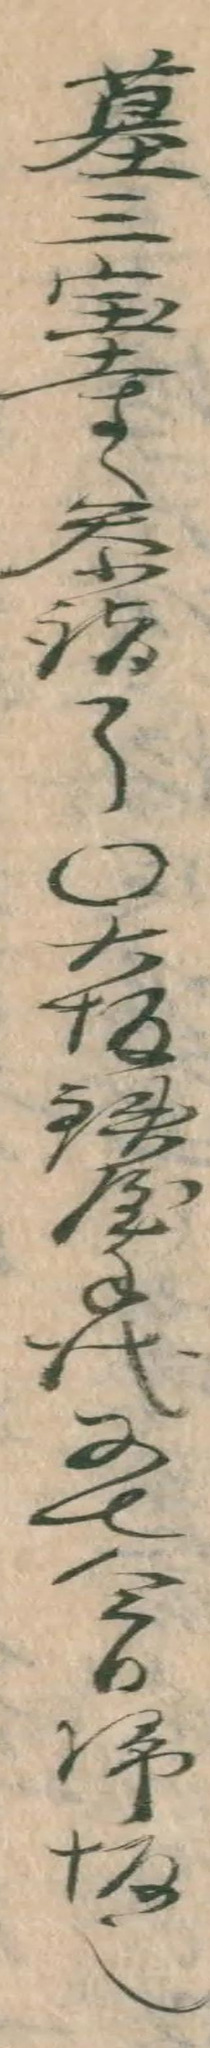墓三宝寺へ参詣了○大坂鉄屋手代又七今日帰坂也
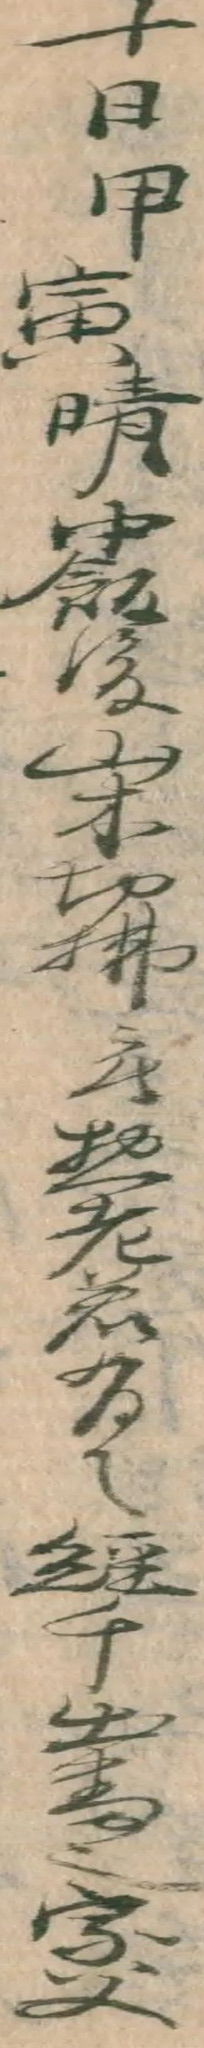十日甲寅晴中飯後山木切払ニて惣老若有之経千出番也家又
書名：賀茂社記録. 第65冊
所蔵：国立国会図書館 National Diet Library, JAPAN
